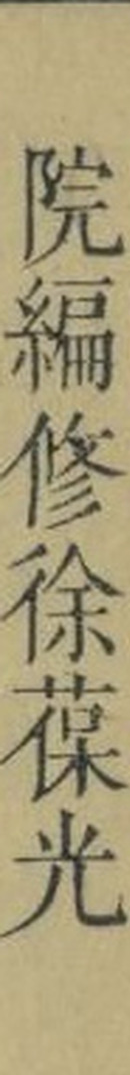院編修徐葆光
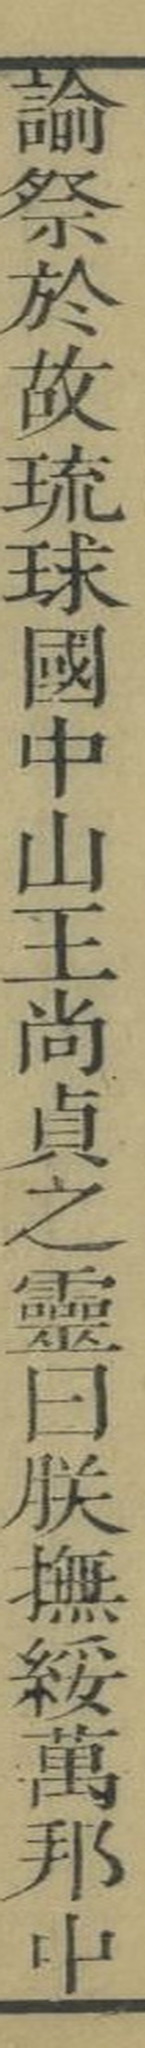諭祭於故琉球國中山王尚貞之靈曰朕撫綏萬邦中
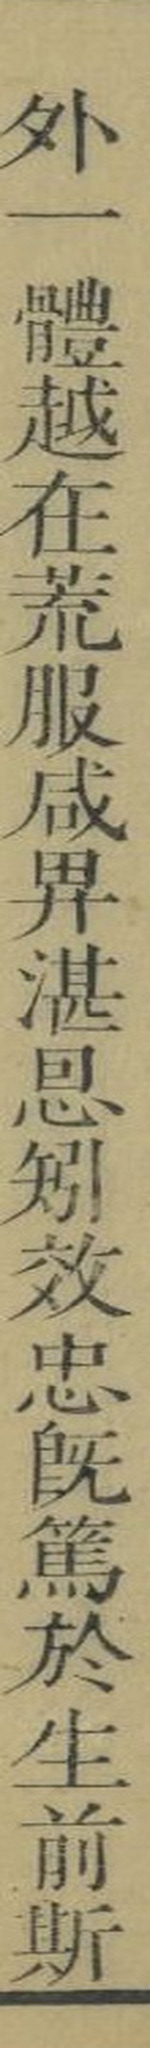外一體越在荒服咸畀湛㤙矧效忠既篤於生前斯
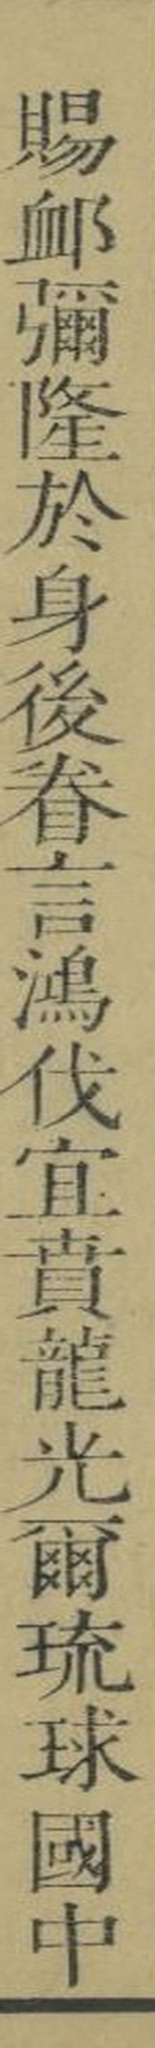賜䘏彌隆於身後眷言鴻伐宜賁龍光爾琉球國中
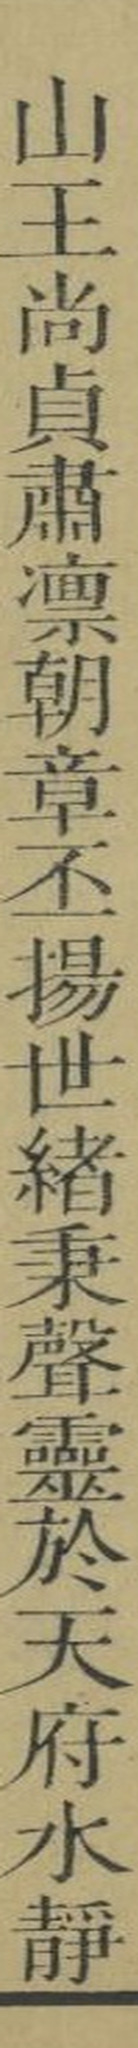山王尚貞肅凛朝章丕揚世緖秉聲靈於天府水靜
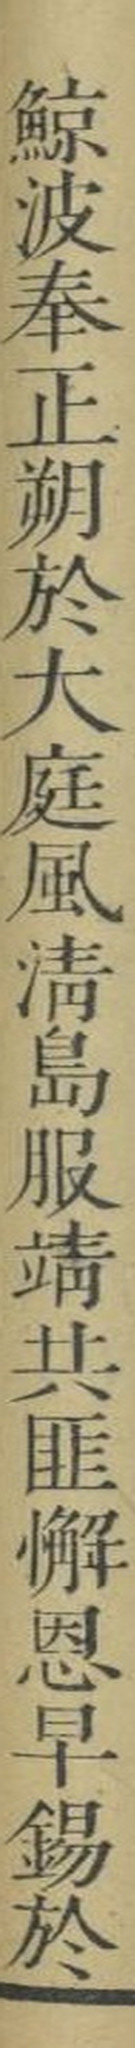鯨波奉正朔於大庭風淸島服靖共匪懈恩早錫於
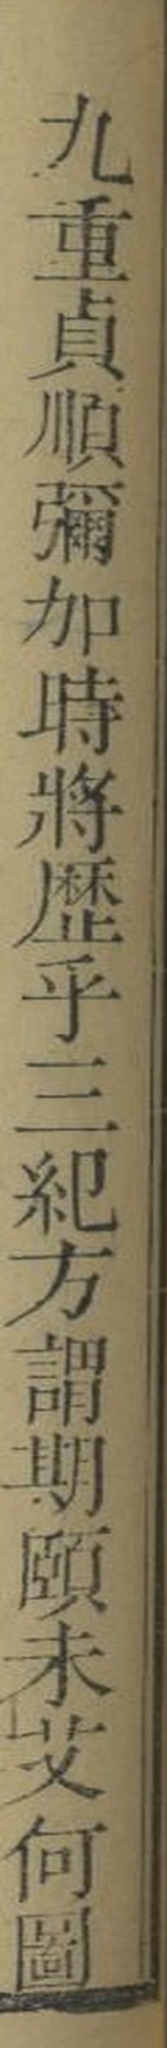九重貞順彌加時將歴乎三紀方謂期頤未艾何圖
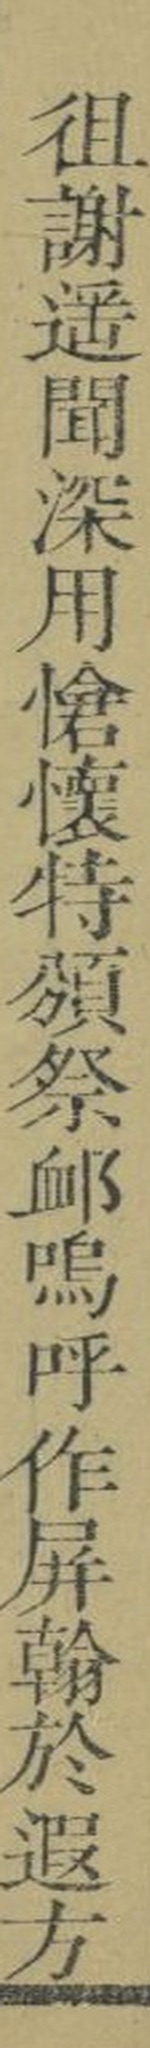徂謝遥聞深用愴懷特領祭䘏嗚呼作屏翰於遐方
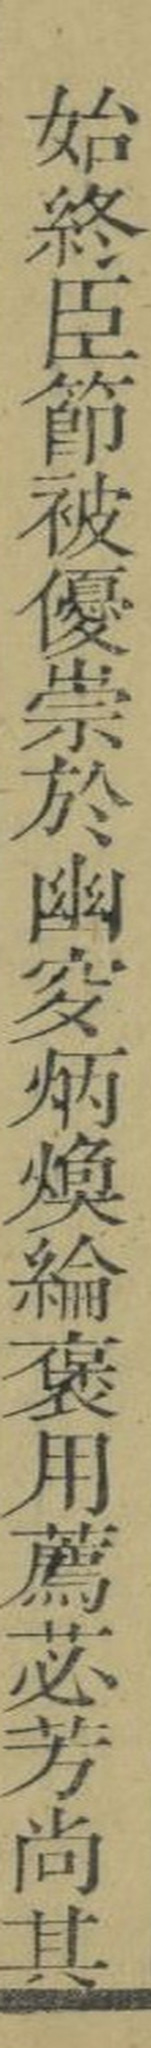始終臣節被優崇於幽穸炳煥綸褒用薦苾芳尚其
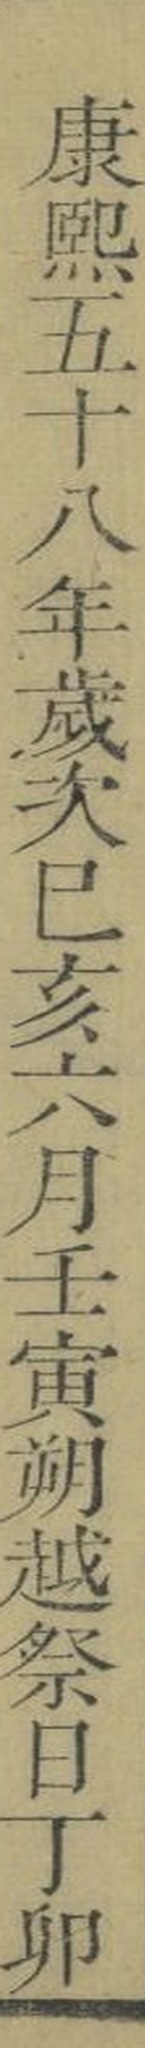康煕五十八年歲次巳亥六月壬寅朔越祭日丁卯
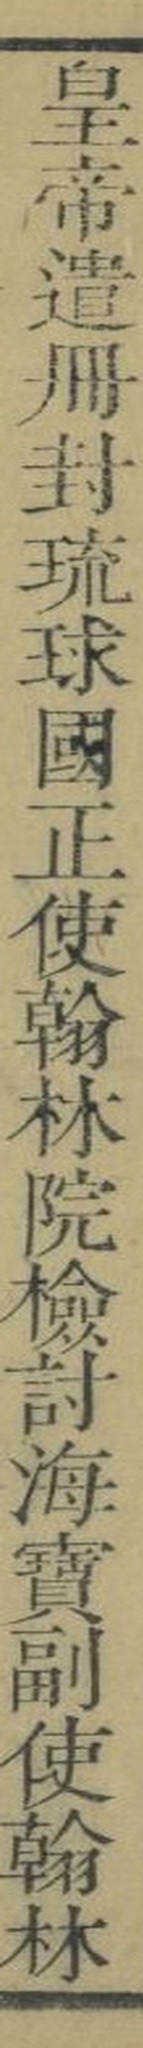皇帝遣冊封琉球國正使翰林院檢討海寶副使翰林
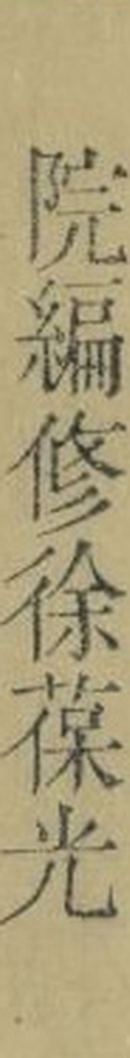院編修徐葆光
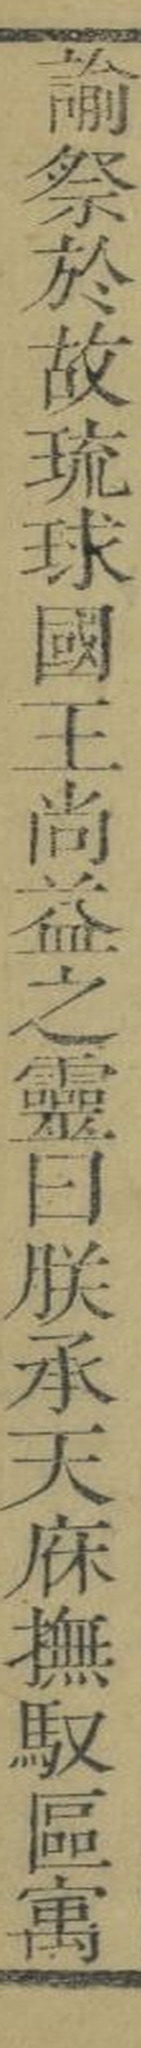諭祭於故琉球國王尚益之靈曰朕承天庥撫馭區㝢

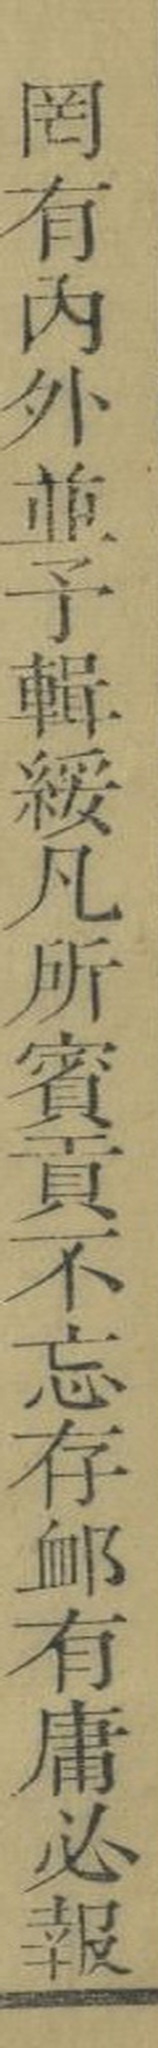罔有内外並予輯綏凡所賓貢不忘存䘏有庸必報
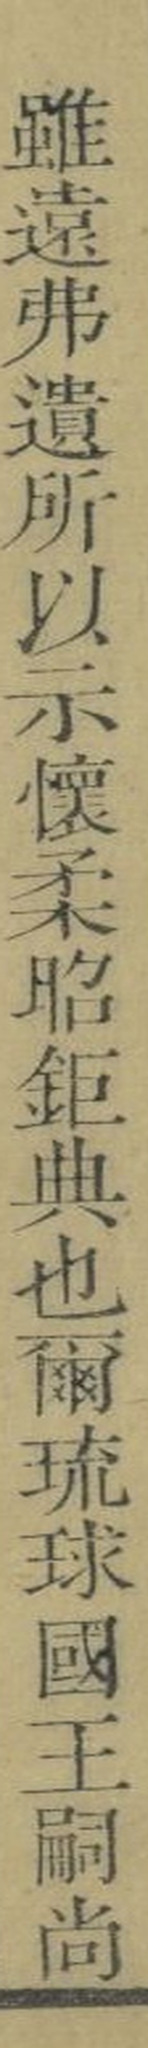雖遠弗遺所以示懷柔昭鉅典也爾琉球國王嗣尚
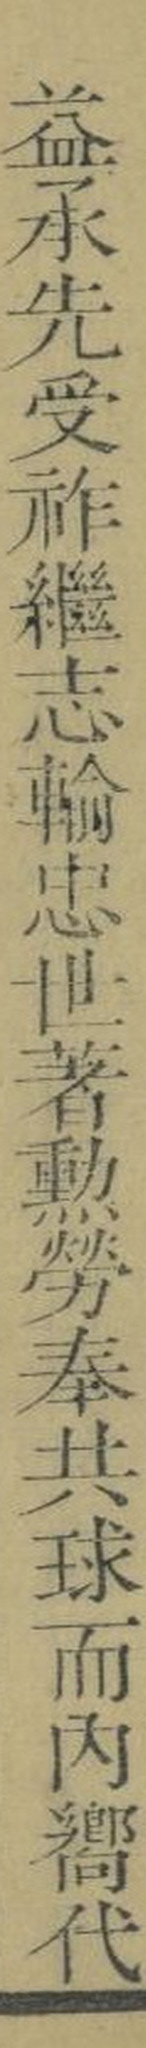益承先受祚繼志輪忠世著勳勞奉共球而内嚮代
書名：中山伝信録 巻二
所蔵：University of the Ryukyus Library
